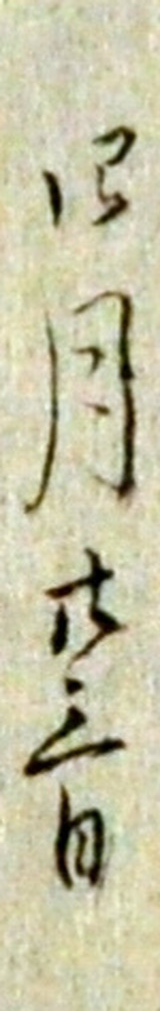四月廿三日
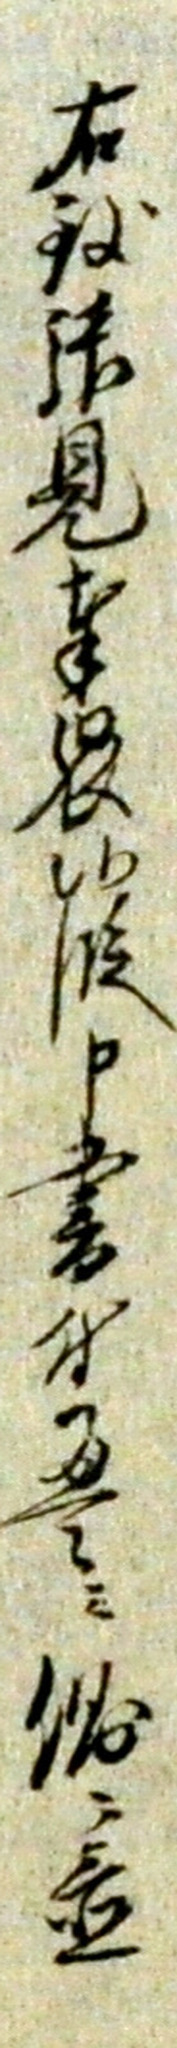右致拝見奉畏候段申書付畳之側ニ置
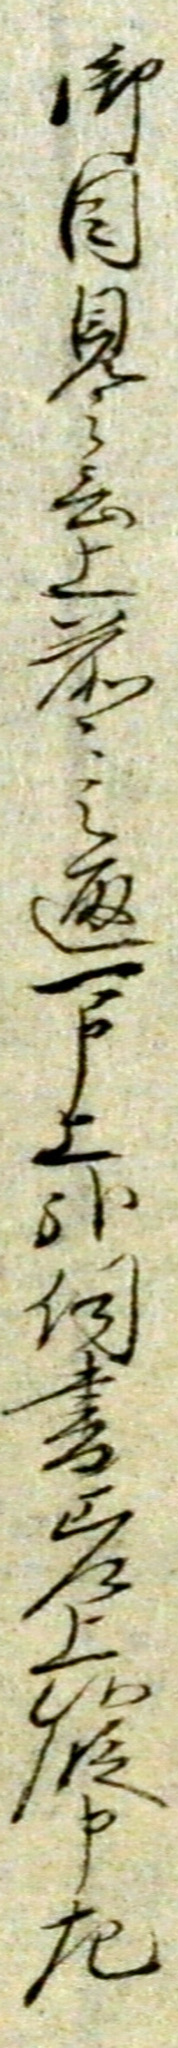御目見之言上前々之通可申上哉伺書差上候段申左
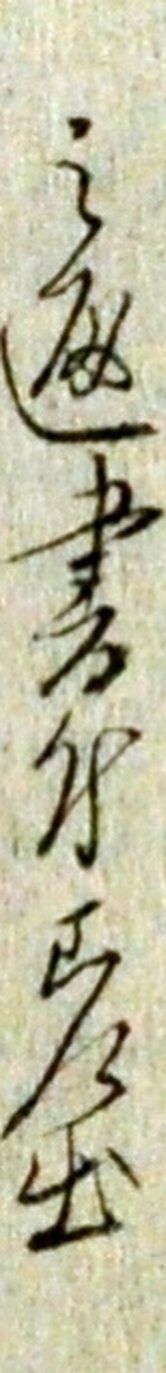之通書付差出
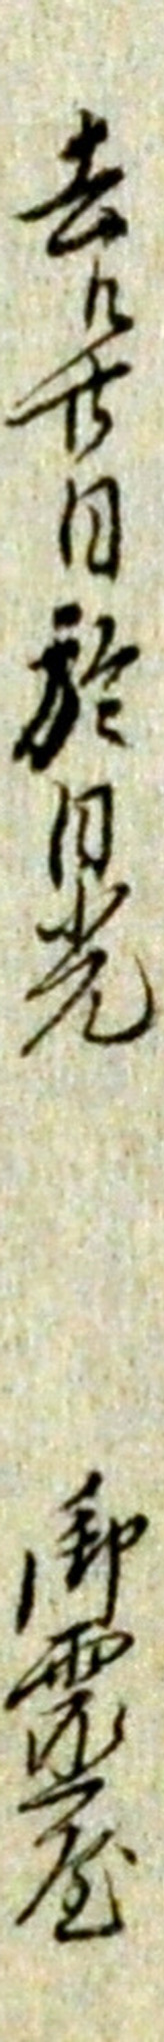去ㇽ廿日於日光御霊屋
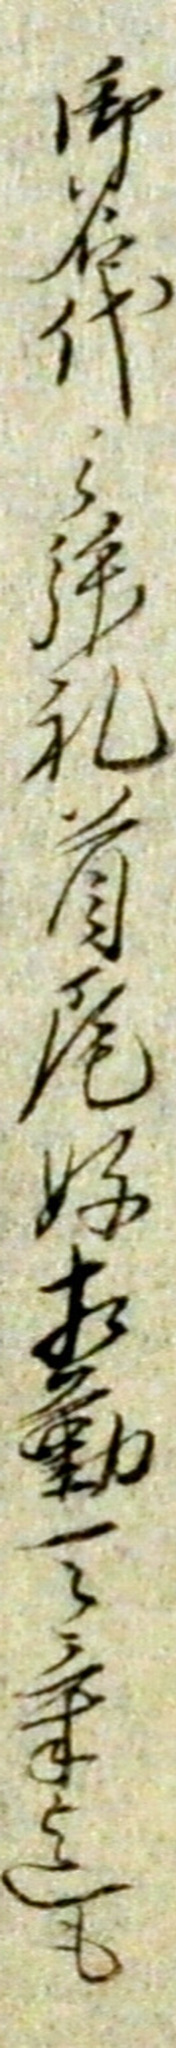御名代之拝礼首尾好相勤天気迄も
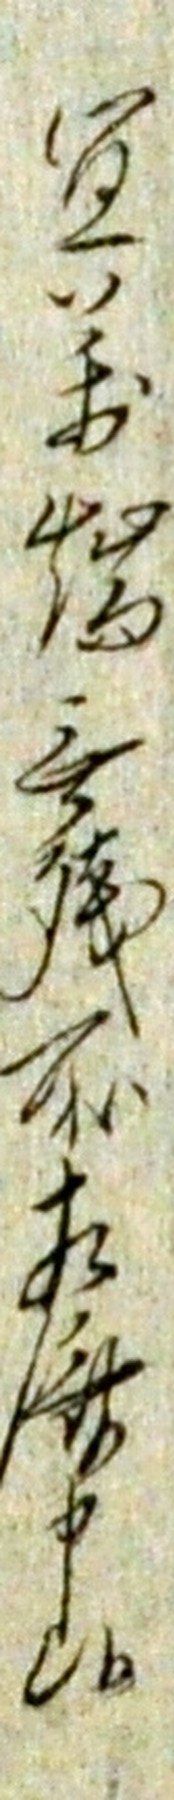宜萬端無残所相済申候
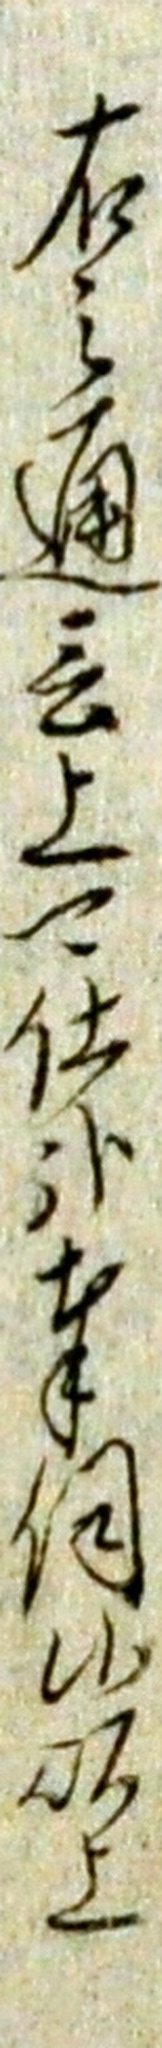右之通言上可仕哉奉伺候以上
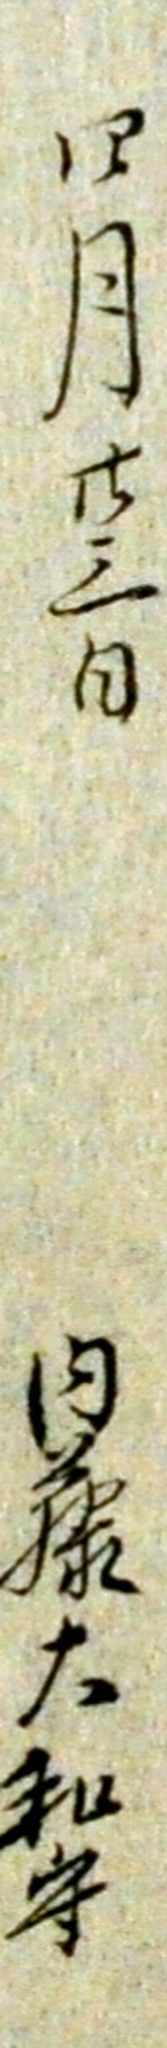四月廿三日内藤大和守
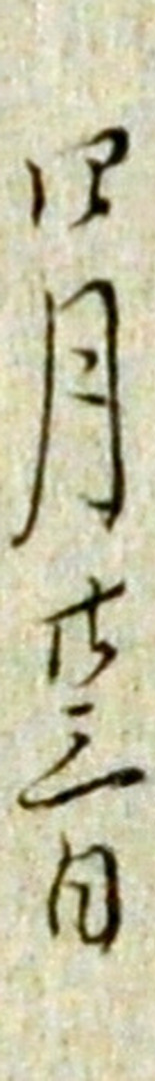四月廿三日
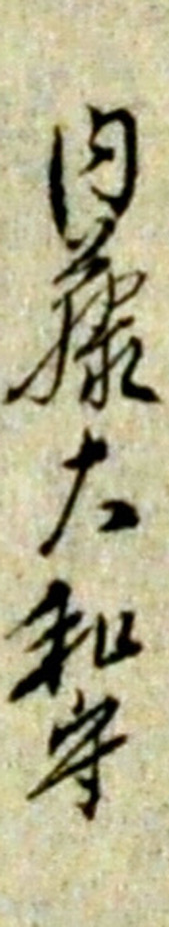内藤大和守
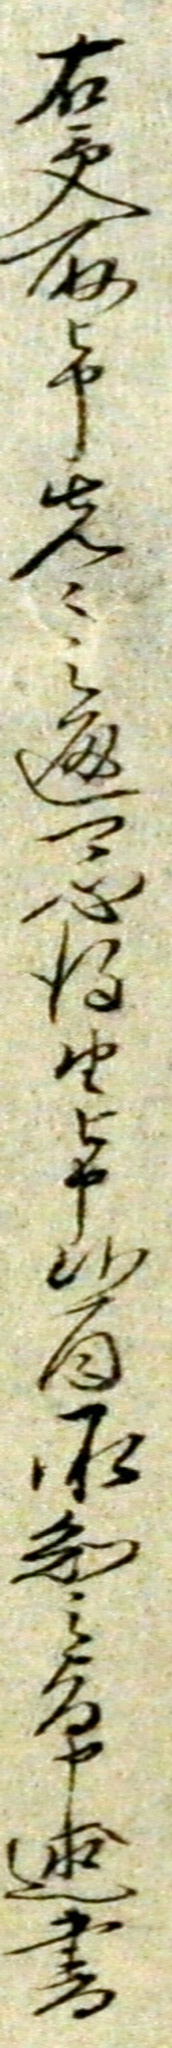右受取ヒ申先々之通可心得由ヒ申候間承知之旨申述書付者
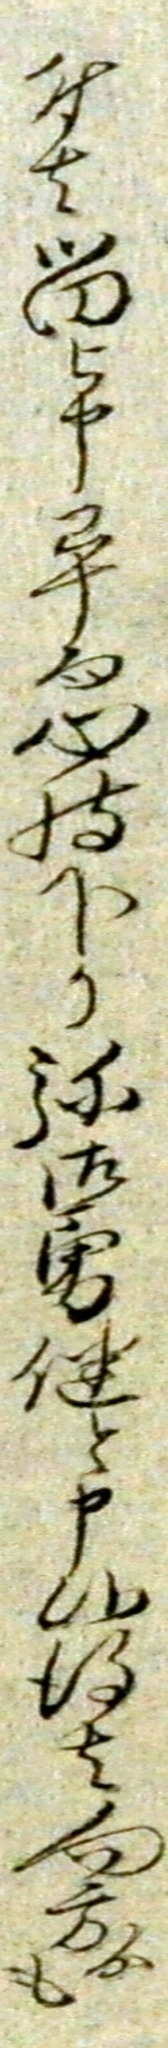留ヒ申畢而心持下り弥御勇健と申候得者向方ゟも
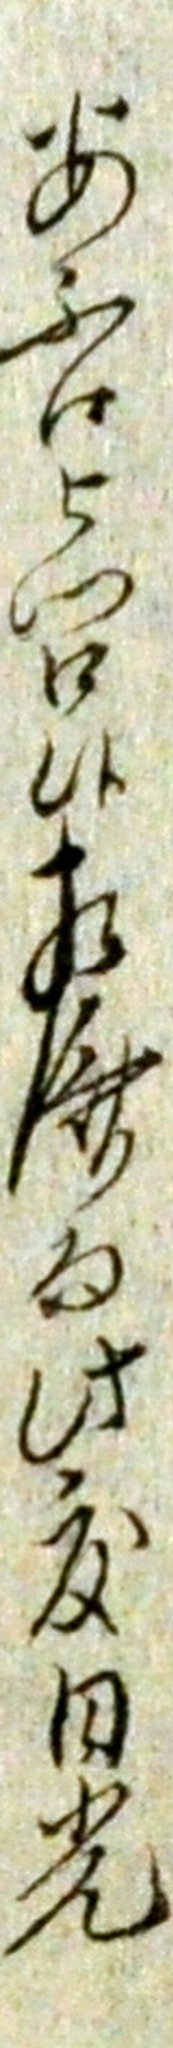安否ヒ問候相済而此度日光
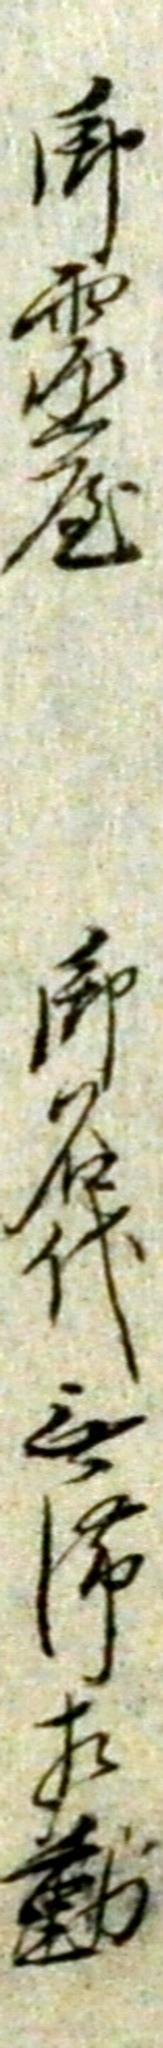御霊屋御名代無滞相勤
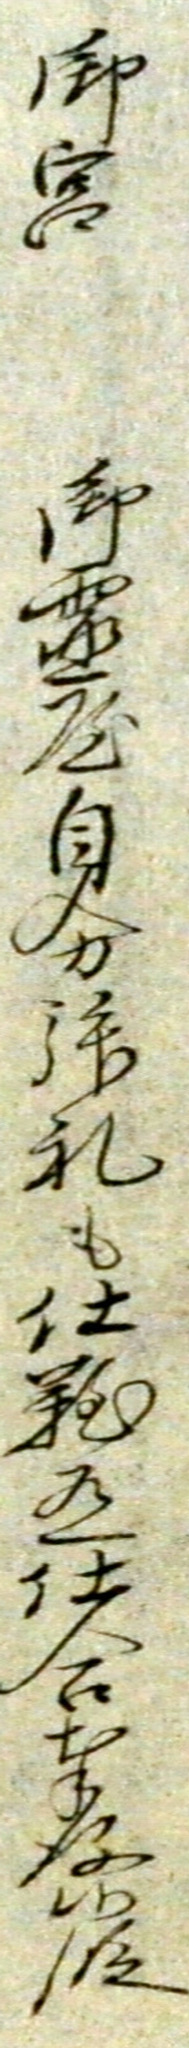御宮御霊屋自分拝礼も仕難有仕合奉存候段
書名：日光御名代相勤候節ノ留
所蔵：伊那市立高遠町図書館・合同会社AMANE
